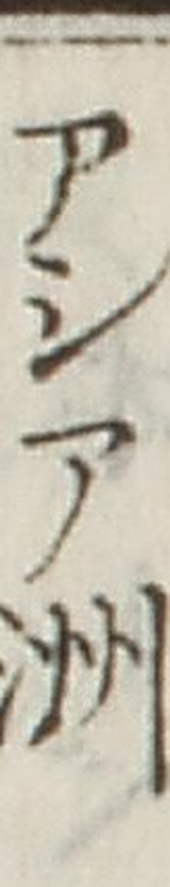アジア洲
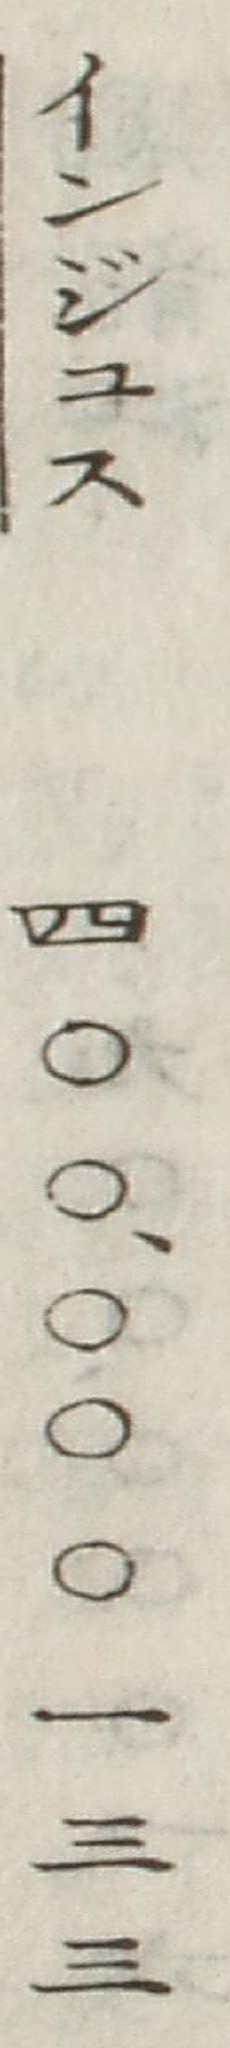インジュス四〇〇、〇〇〇一三三
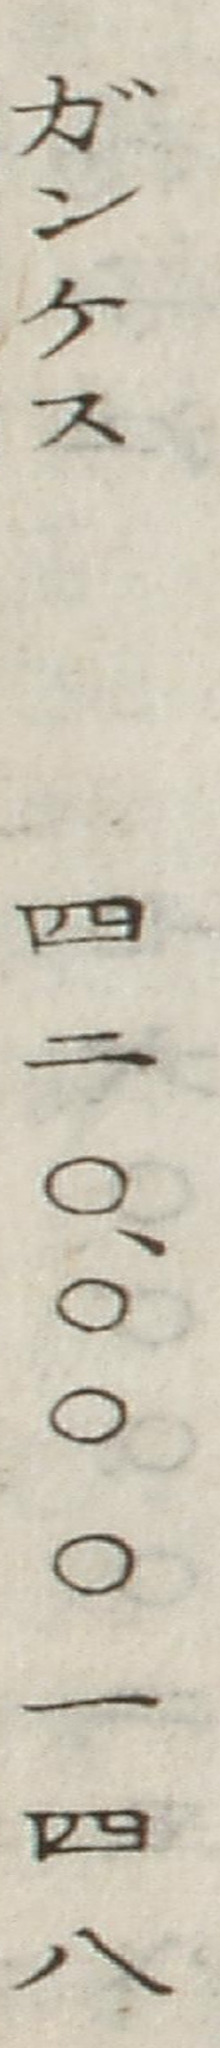ガンケス四二〇、〇〇〇一四八

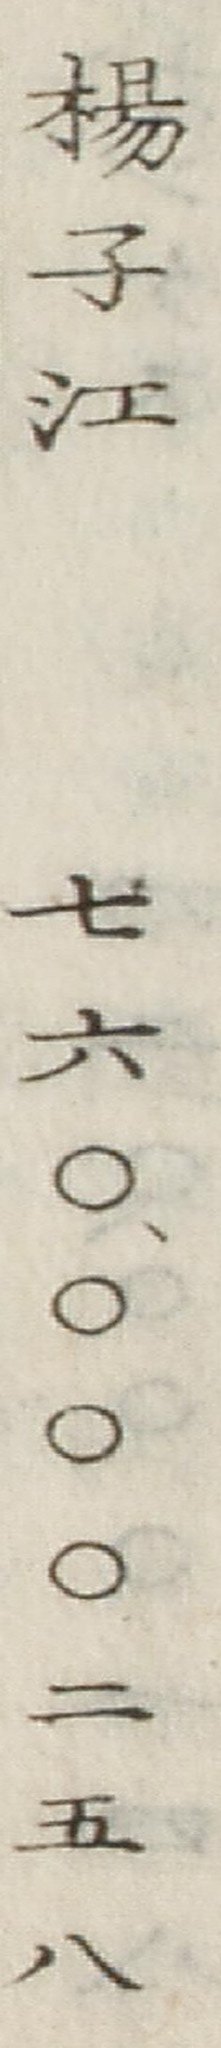揚子江七六〇、〇〇〇二五八
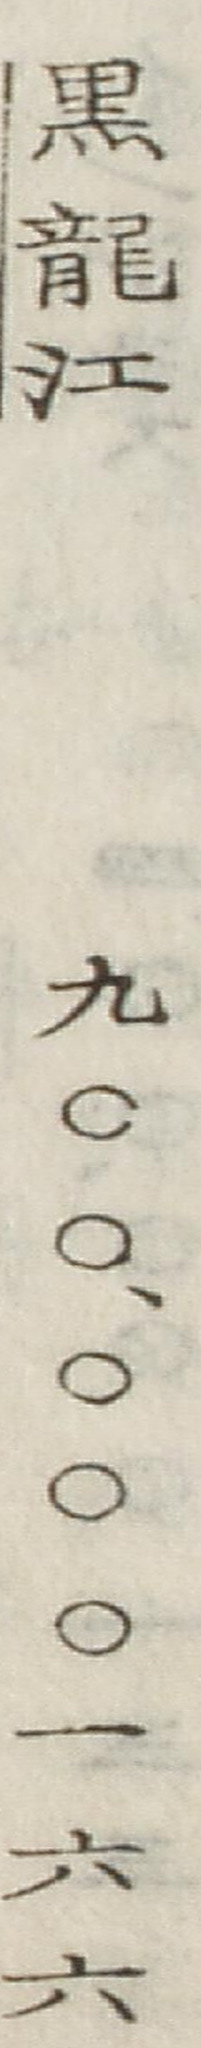黒龍江九〇〇、〇〇〇一六六
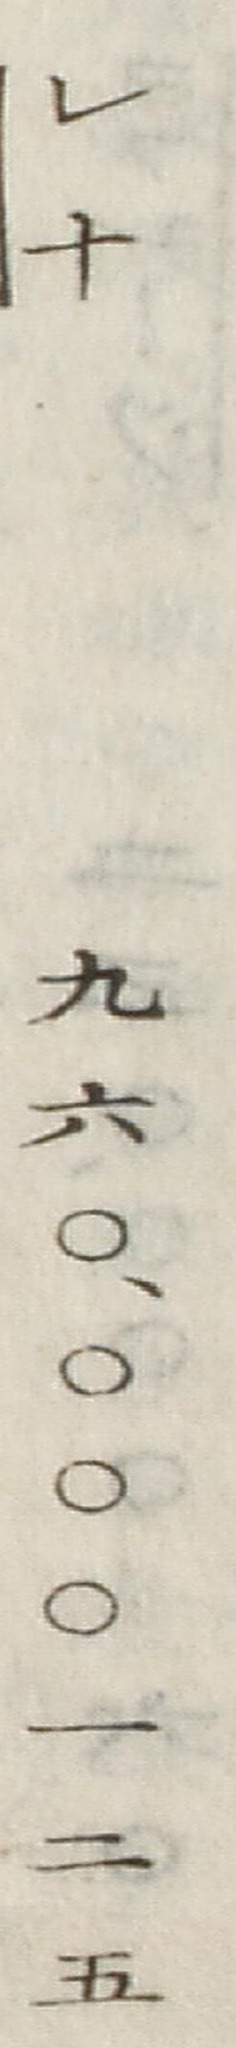レナ九六〇、〇〇〇一二五
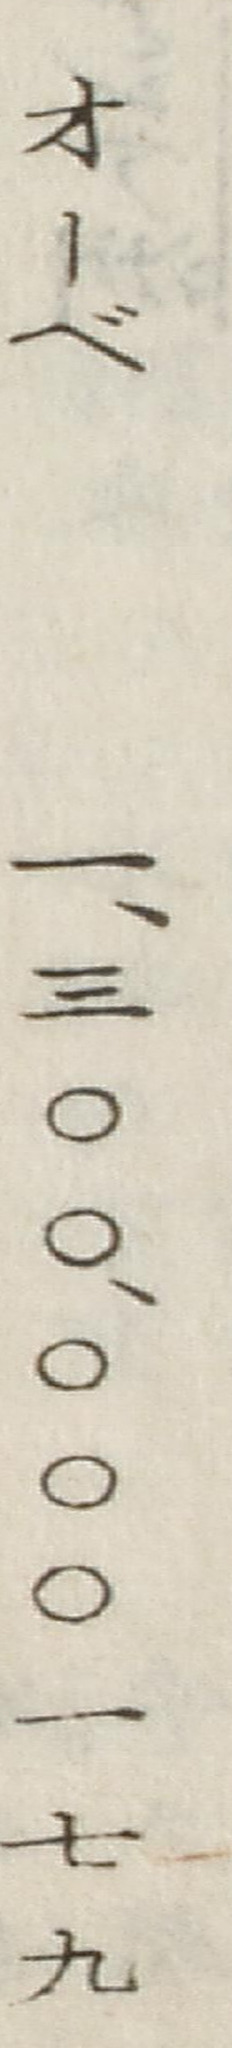オーベ一、三〇〇、〇〇〇一七九
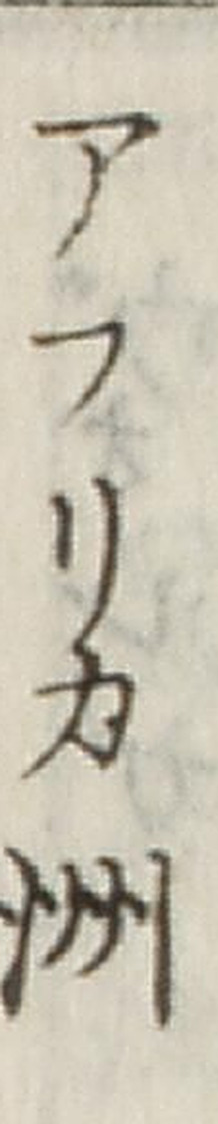アフリカ洲
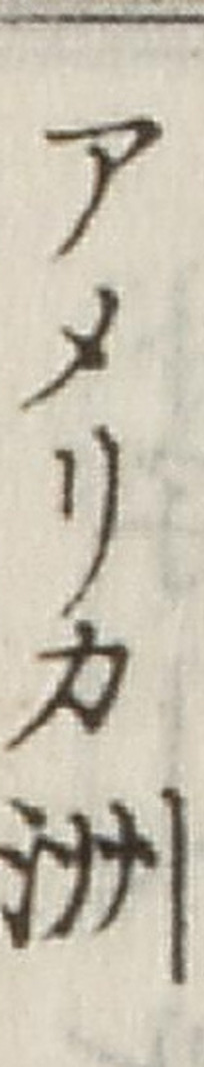アメリカ洲
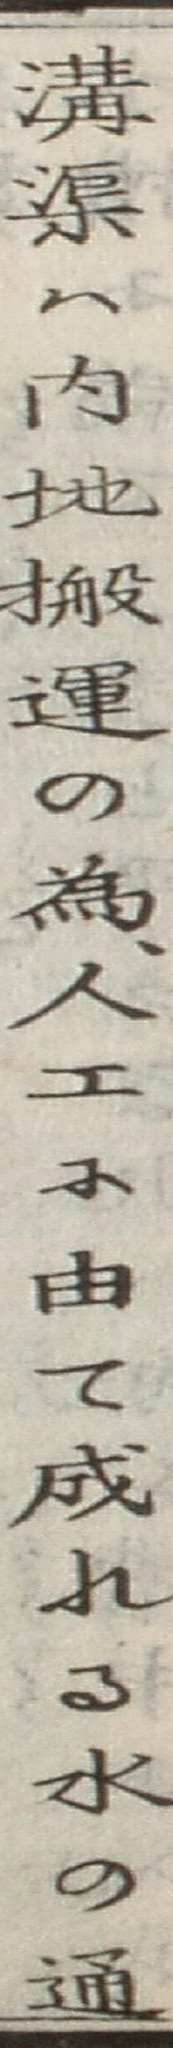溝渠は内地搬運の為人工に由て成れる水の通
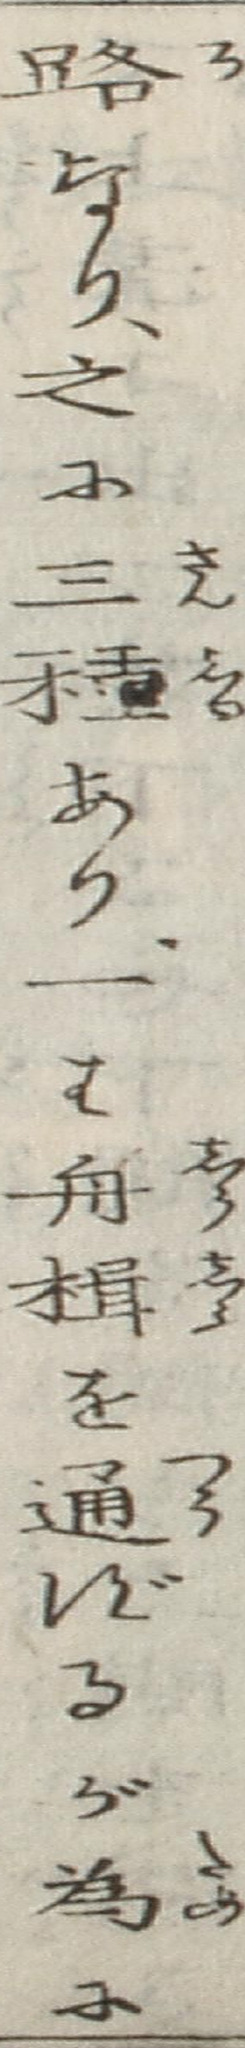路なり、之に三種あり、一は舟楫を通ずるが為に
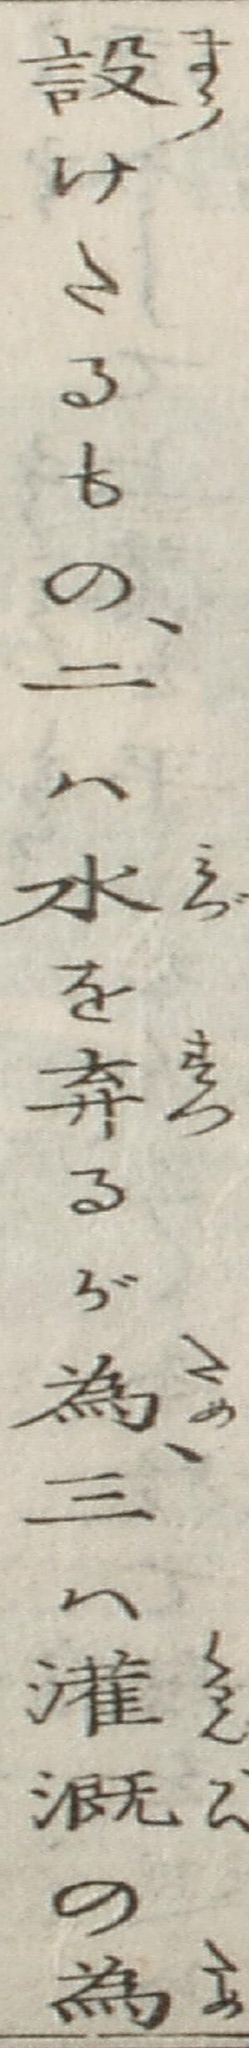設けたるもの、二は水を棄るが為、三は灌漑の為
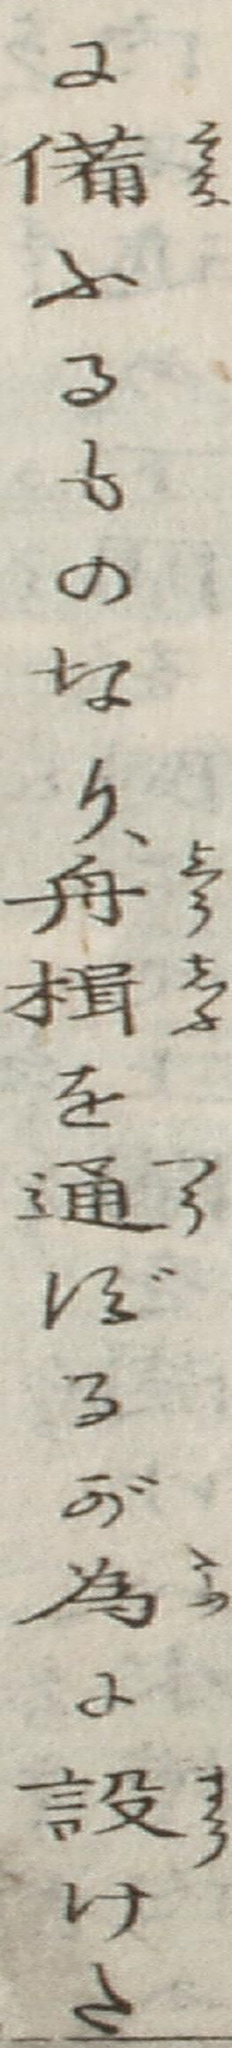に備ふるものなり、舟楫を通ずるが為に設けた
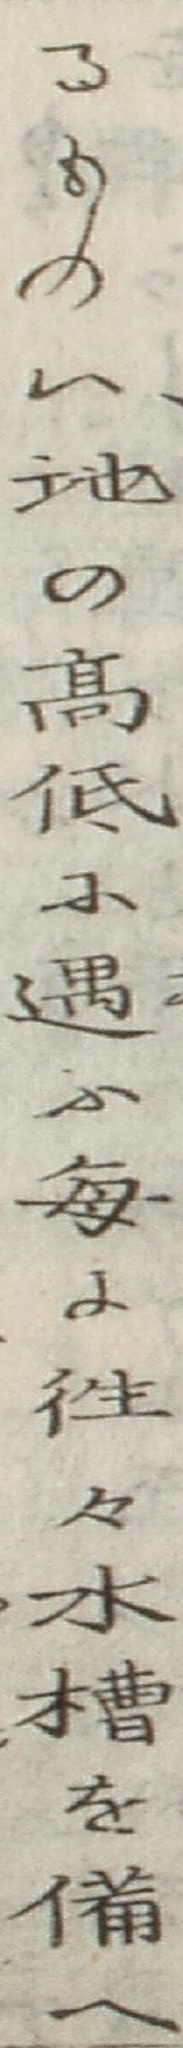るものは、地の高低に遇う毎に往々水槽を備へ、
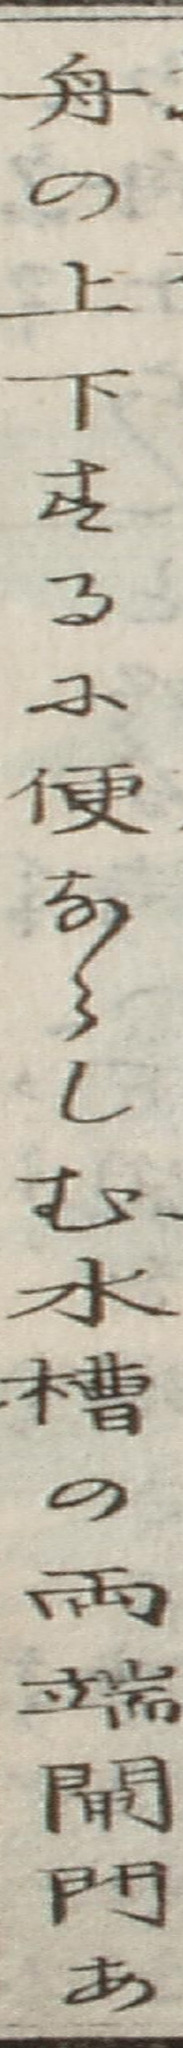舟の上下するに便ならしむ、水槽の両端閘門あ

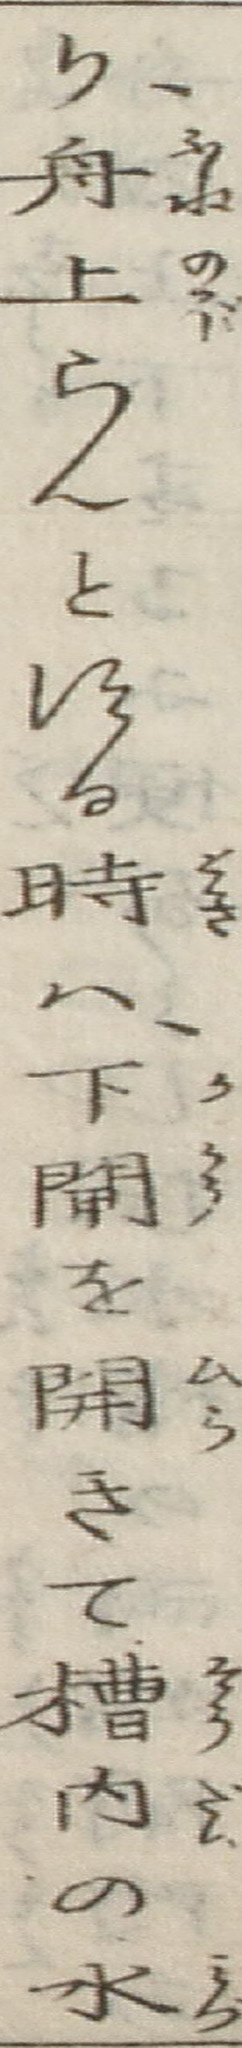り、舟上らんとする時は、下閘を開きて槽内の水
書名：訓蒙　天然地理學　中
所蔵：東京大学地震研究所図書室 Earthquake Research Institute Library, The University of Tokyo, JAPAN
